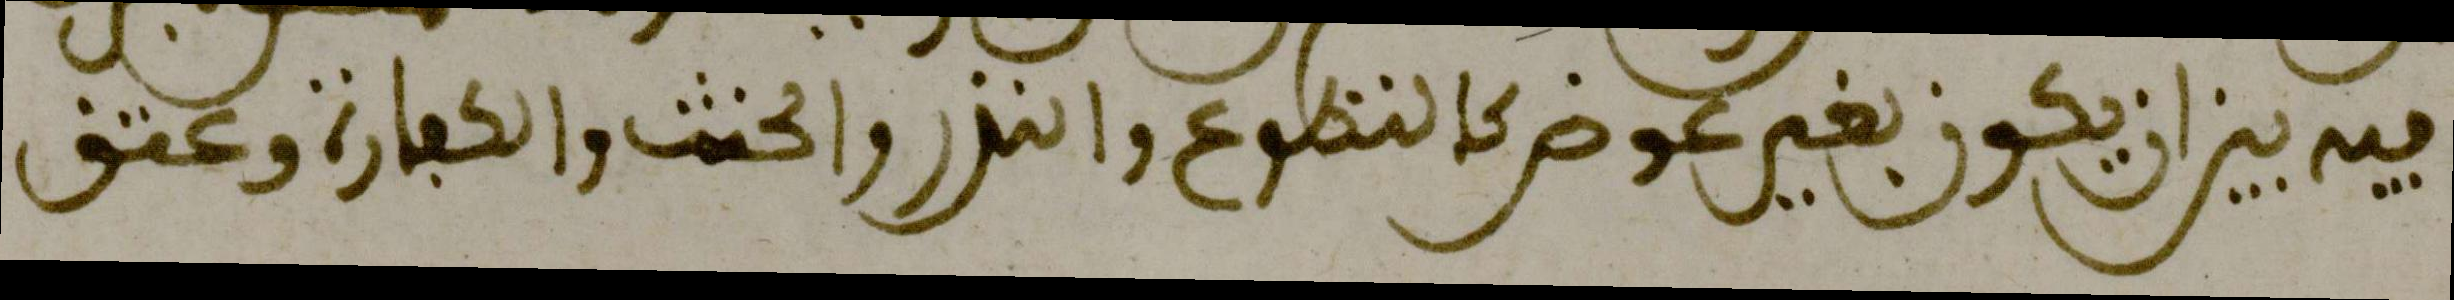فيه بين ان يكون بغير عوض كالتطوع والنذر والحنث والكفارة وعتق
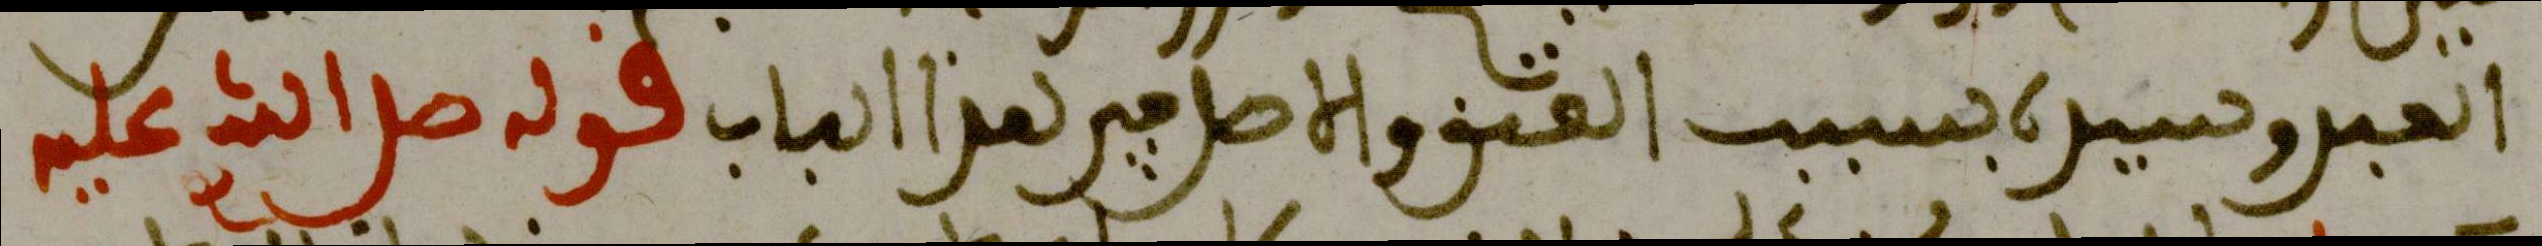العبد وسيده بسبب العتق والاصل في هذا الباب قوله صل الله عليه
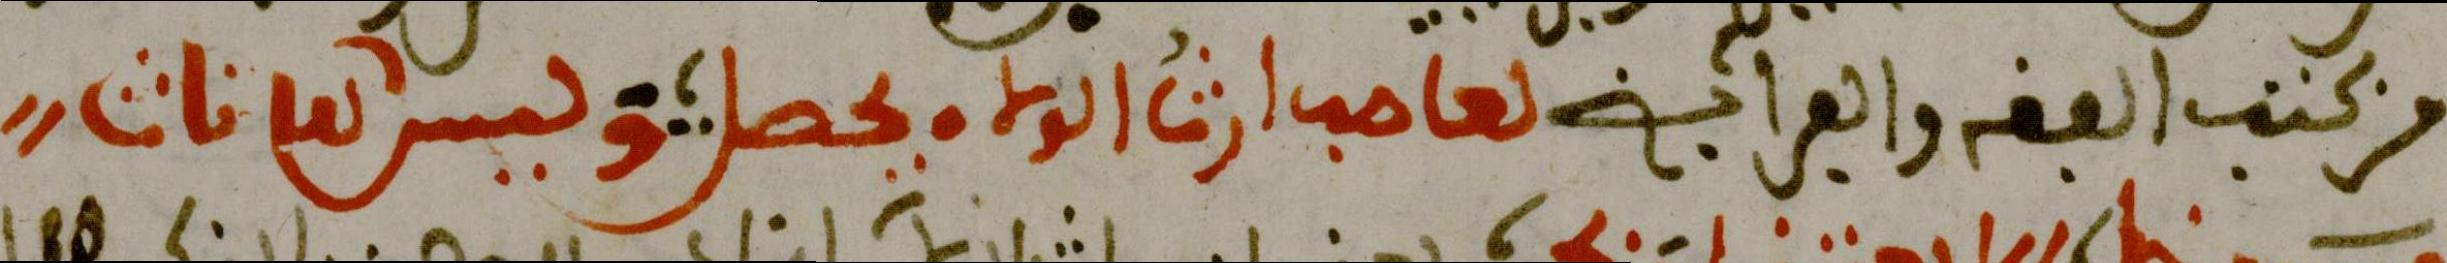من كتب الفقه والفرائض لعاصب ارث الولاء يحصل وَليس للاناث
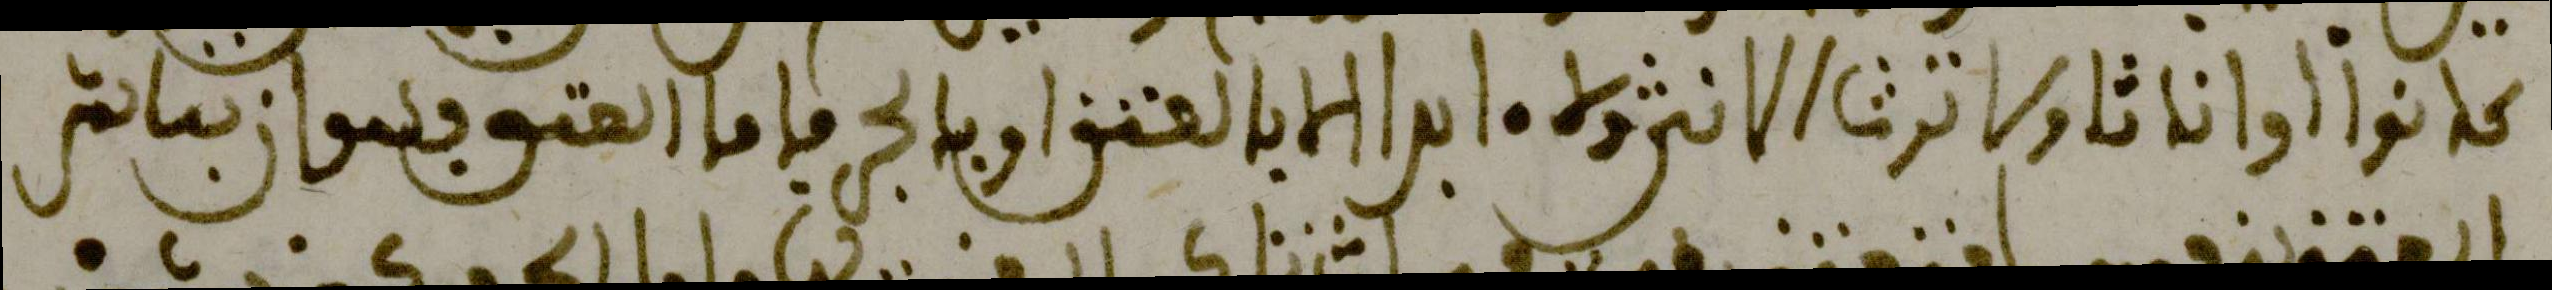كانوا او اناثا ولا ترث الانثى ولاء ابدا الا بالعتق او بالجر فاما العتق فهو ان تباشر
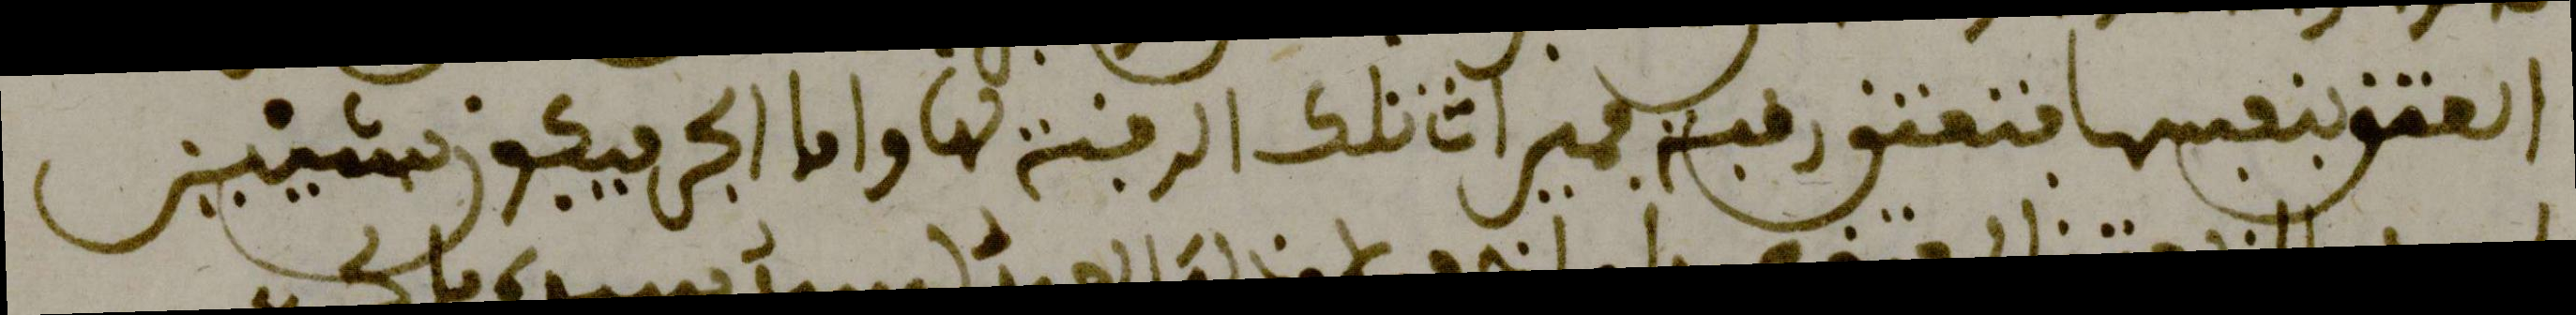العتق بنفسها فتعتق رقبة فميراث تلك الرقبة لها واما الجر فيكون بشيئين
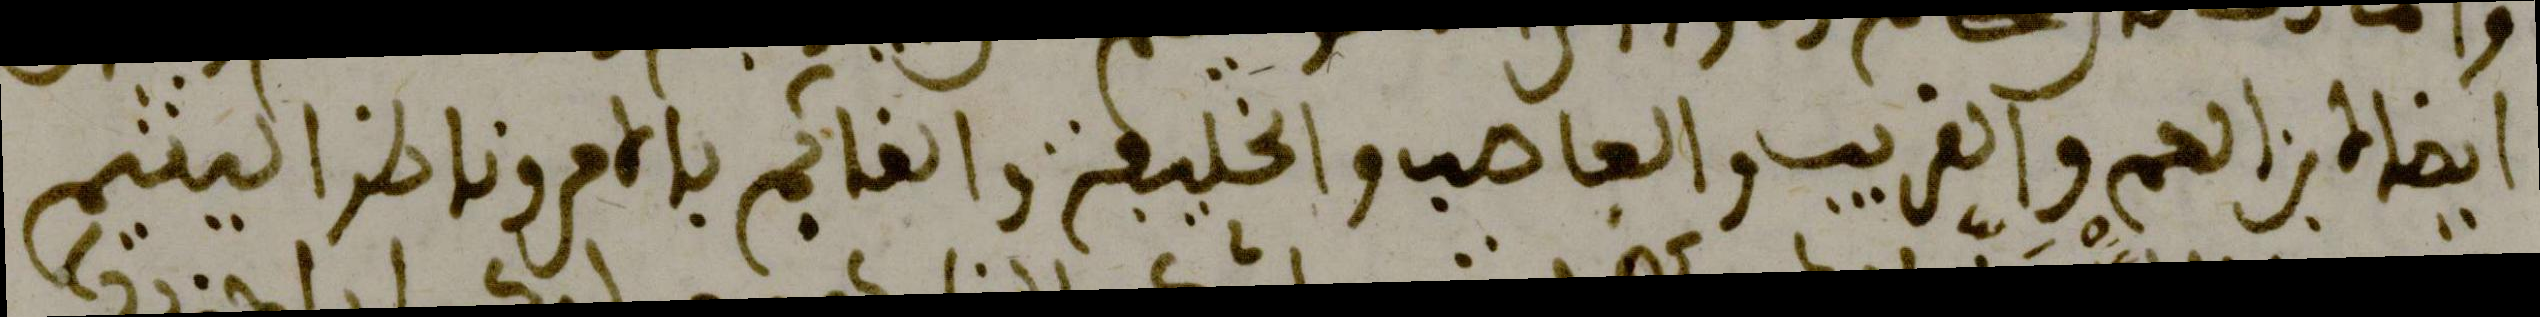ايضا لابن العم والقريب والعاصب والخليفة والقائم بالامر وناظر اليتيم
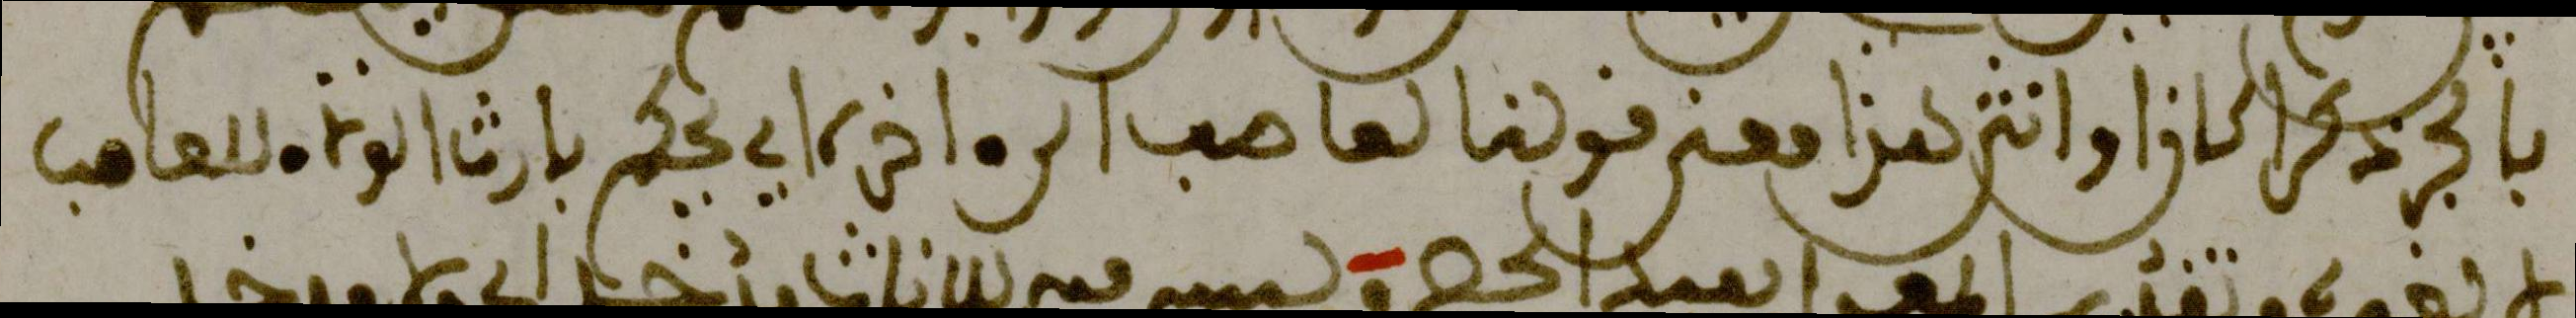بالجر ذكرا كان او انثى هذا معنى قولنا لعاصب الى ءاخره اي يحكم بارث الولاء للعاصب
